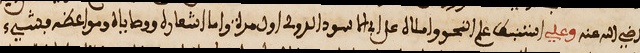رضي الله عنه وعلي استنبط علم النحو واملاه على ابي الاسود الدولى اول مرة واما اشعاره ووصاياه ومواعظه فشيء
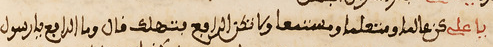يا على كن عالما ومتعلما ومستمعا ولا تمن الرابع فتهلك قال وما الرابع يا رسول
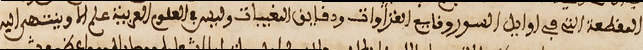المقطعة التي في اوايل السور وقايع الغزاوات ودقايق المغيبات وليس في العلوم العربية علم الا وينتهى اليه
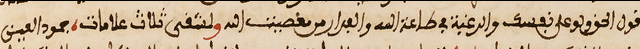قول الحق ولو على نفسك والرغبة في طاعة الله الفرار من مغصيت الله ولشقى ثلاث علامات جمود العين
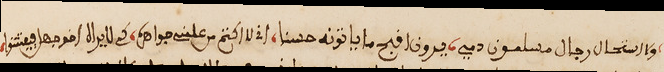ولااستحال رجال مسلمون دمي يرون اقبح ما ياتوبه حسنا انى لا اكتم من علمنى جواهره كم لا يراه اخو جهل فيفتتنوا
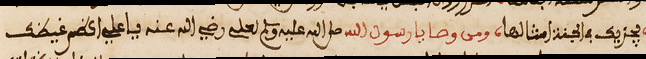يجزيك في الجنة امثالها ومن وصايا رسول الله صلى الله عليه وسلم لعلى رضي الله عنه يا على اكظم غيظك
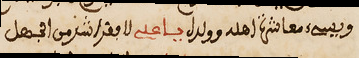ويسئ معاشرة اهله وولده يا على فقر اشد من الجهل
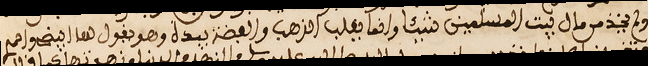ولم يخذ من مال بيت المسلمين شيئا واما يقلب الذهب الفضة يبده وهو يقول لها ابيضى واحمرى
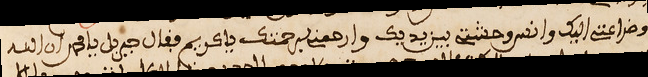وضراعتى اليك وانس وحشتى بين يديك وارحمنى بر حمتك يا كريم فقال جبريل يا محمد ان الله
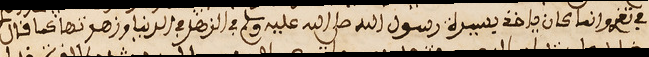في تغرى وانما كان يأخذ بسيرة رسول الله صلى الله عليه وسلم في الزهد في الدنيا وزهرتها كما قال
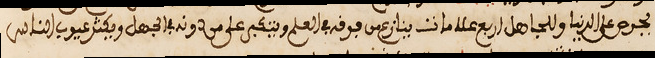يحرص على الدنيا وللجاهل اربع علامات ينازع من فوقه في العلم ويتكبر على من دونه في الجهل ويكثر عيوب الناس
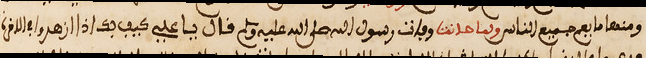ومنها ما يعم جميع الناس ولما حانت وفات رسول الله صلى الله عليه وسلم قال يا علي كيف بك اذا ازهدءا في الاخرة
